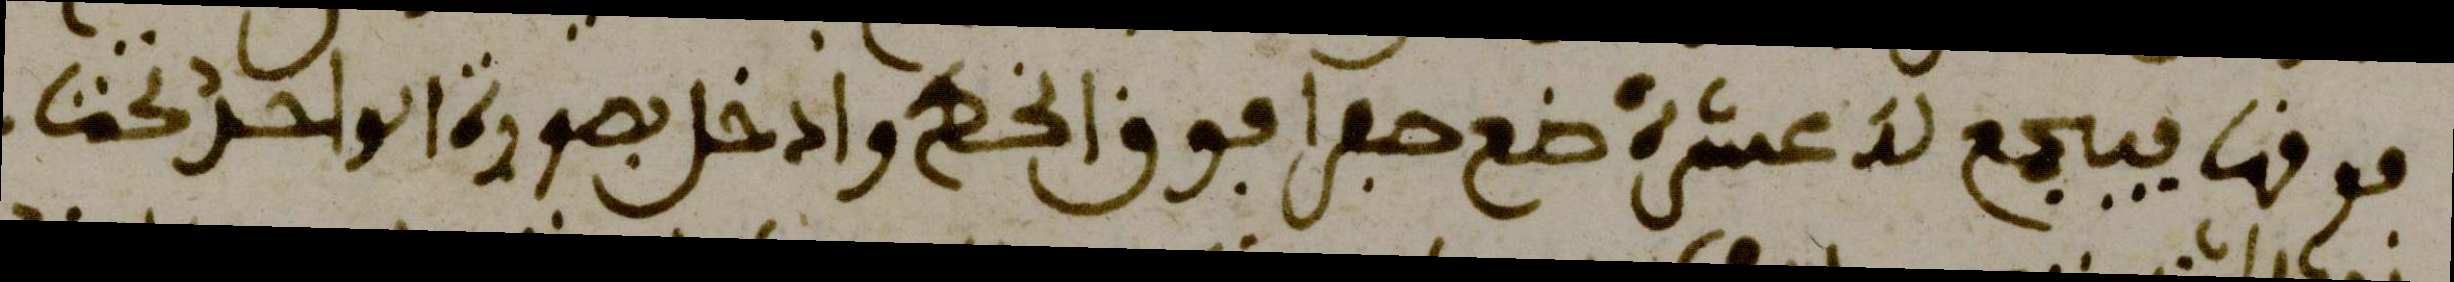فوقها فيجمع لك عشره ضع صفرا فوق الخط وادخل بصورة الواحد تحت
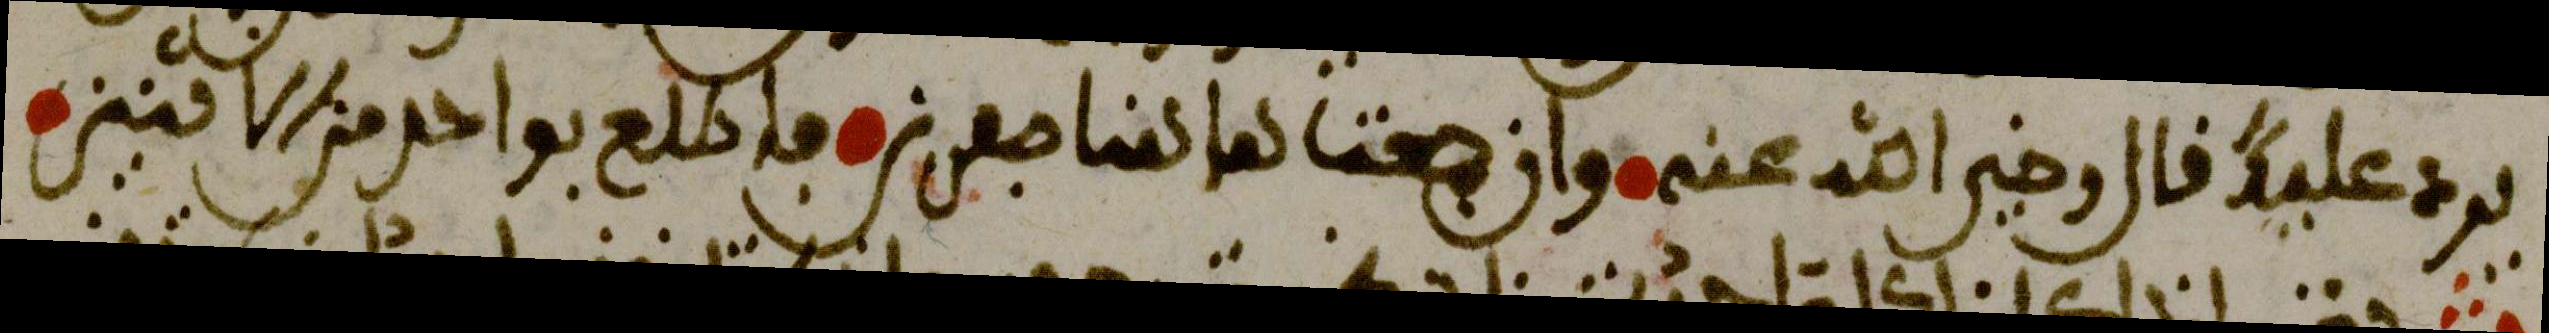يرد عليك قال رضي الله عنه وان جمعت هاهنا صفر بن فاطلع بواحد من الاثنين
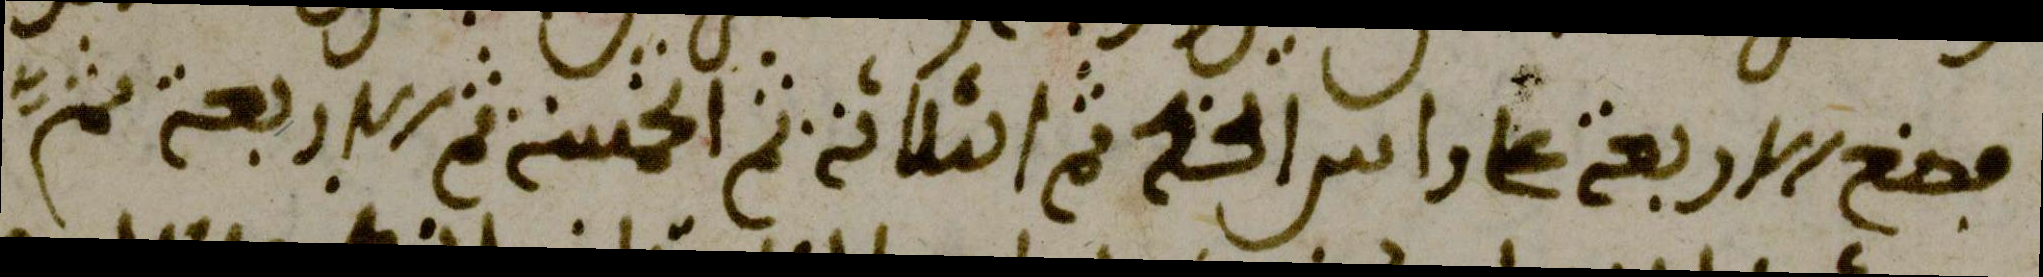فضغ الاربعة على راس الخط ثم الثلاثة ثم الخمسة ثم الاربعة ثم
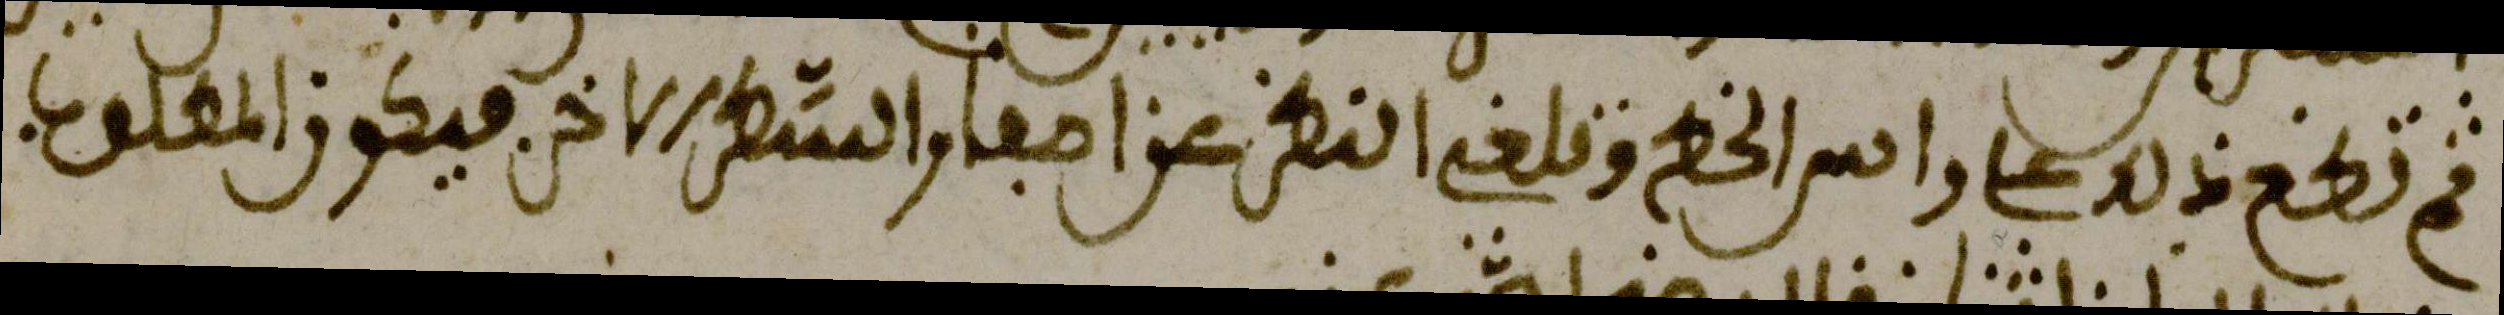ثم تطلغ ذلك على راس الخط وتلغي النظر عن اصفار السطر الاخر فيكون المطلوب
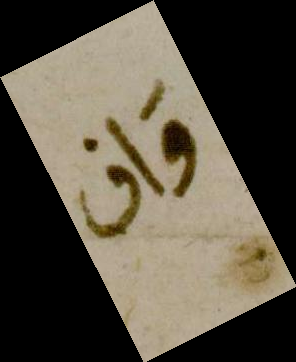وان
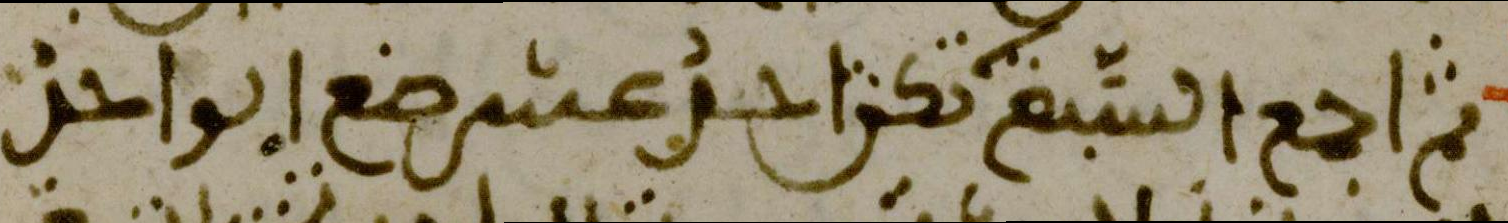ثم اجمع السبعة تكن احد عشر ضع ابو احد
